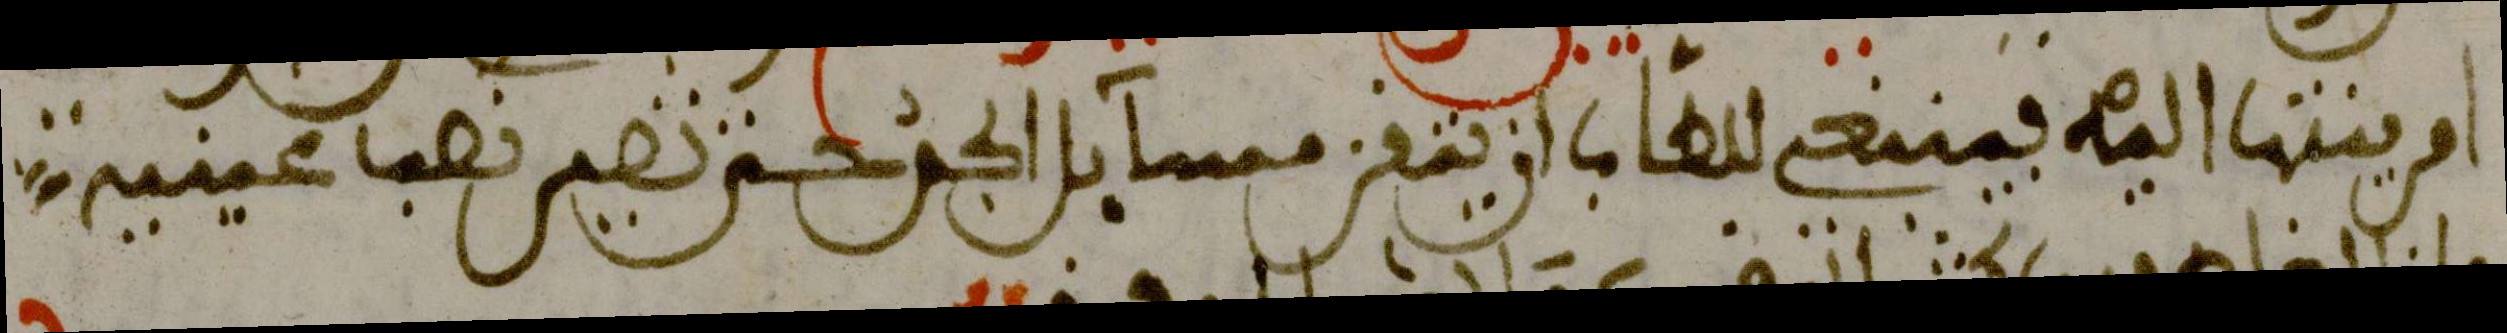امر ينتها اليْه فينبغي للطاب ان يتقن مسائل الجد حتى تصير نصب عينيه
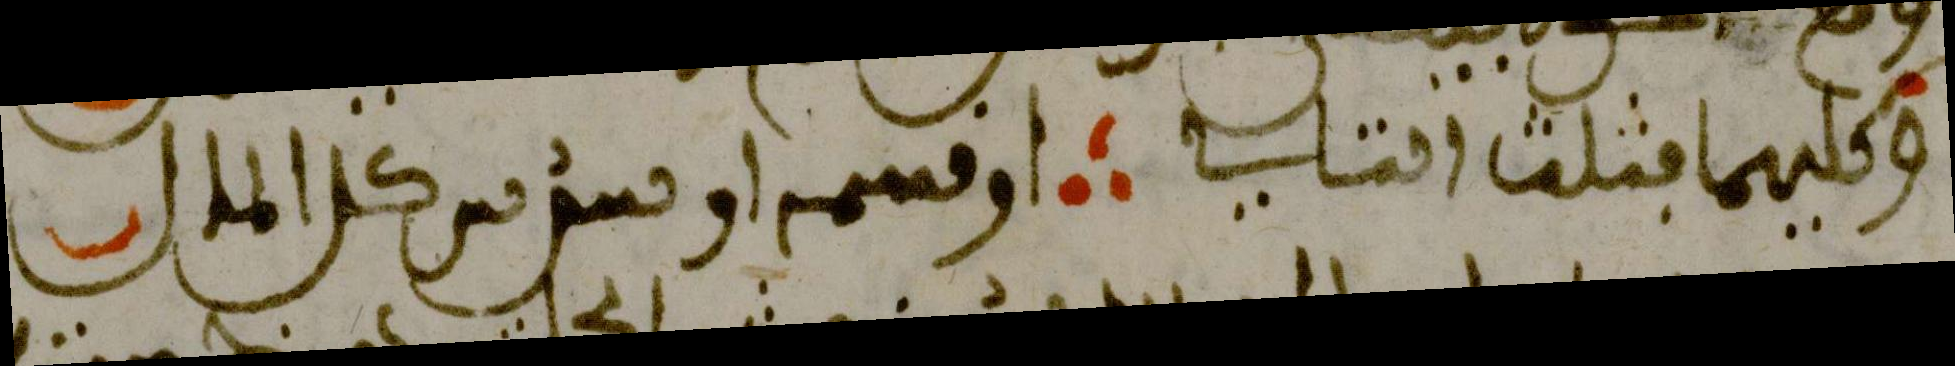وَكليهما فثلث التالي او قسمه او سدس كل المال
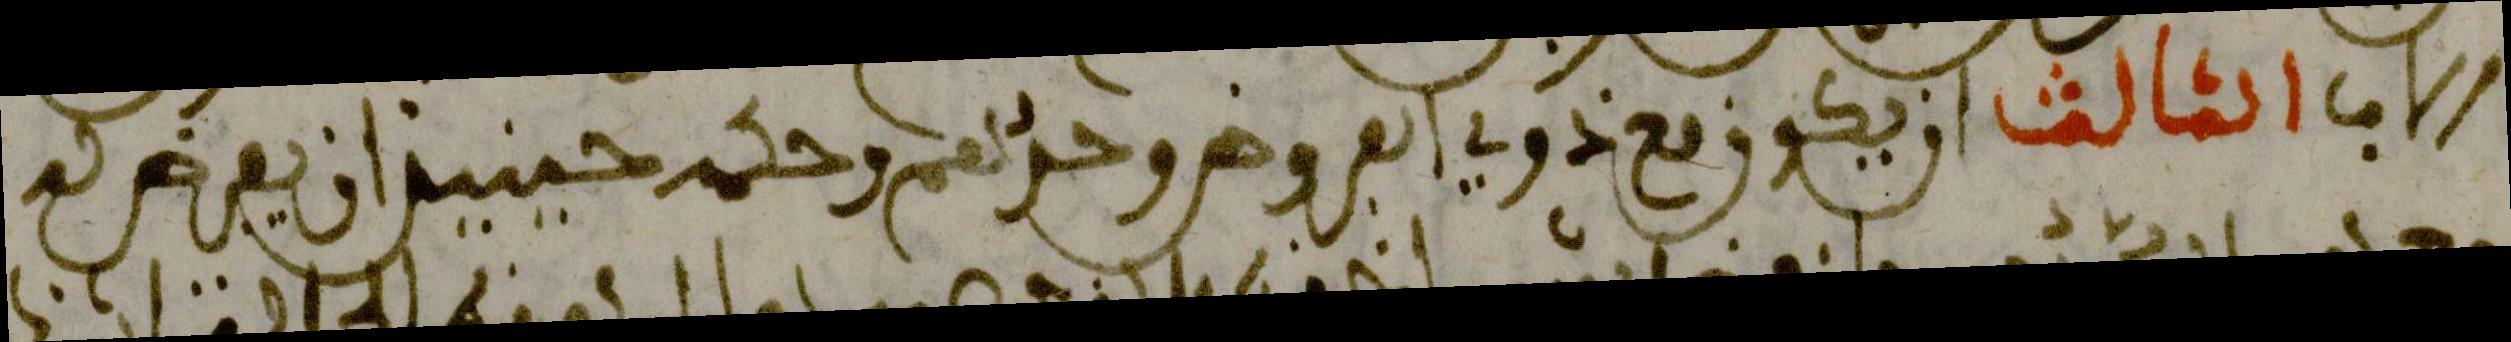الاب الثالث ان يكون مع ذوي الفروض وحدهم وحكمه حينيذ ان يفرض له
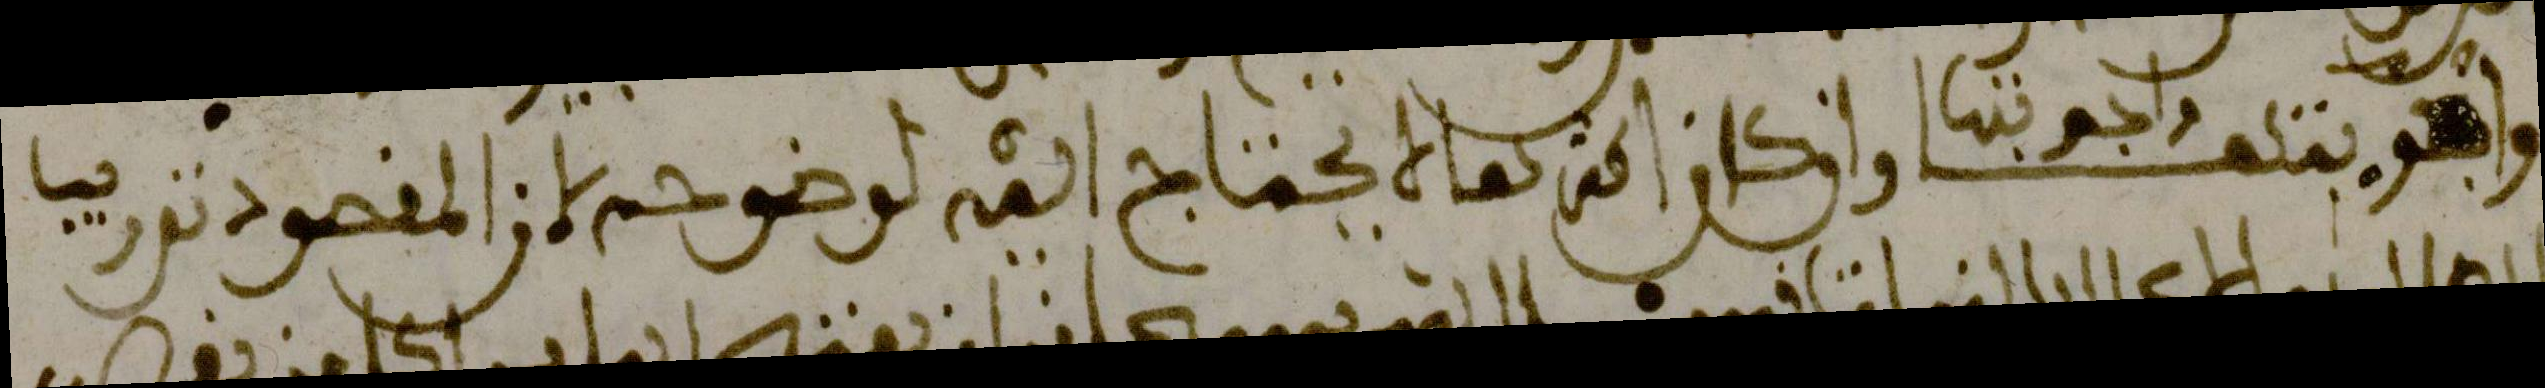واهوبتها وان كان اكثرها لا يحتاج اليْه لو ضوحه لان المقصود تدريب
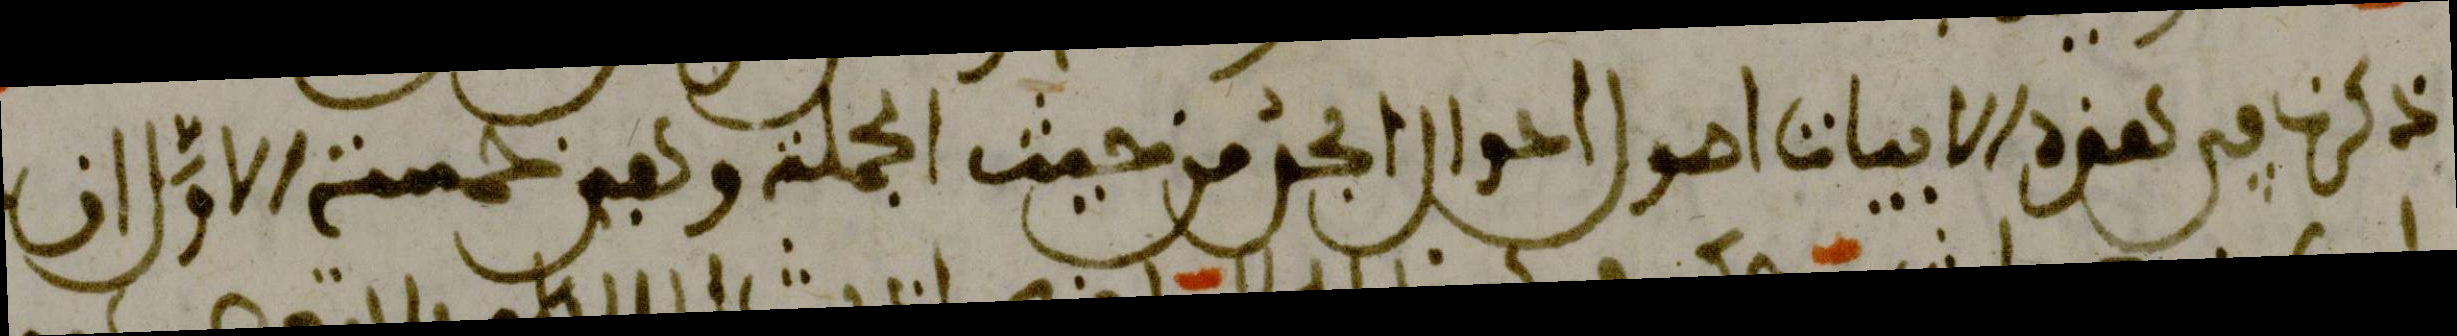ذكرن في هذه الابيات اصول احوال الجد من حيث الجملة وهي خمسة الاوّل ان
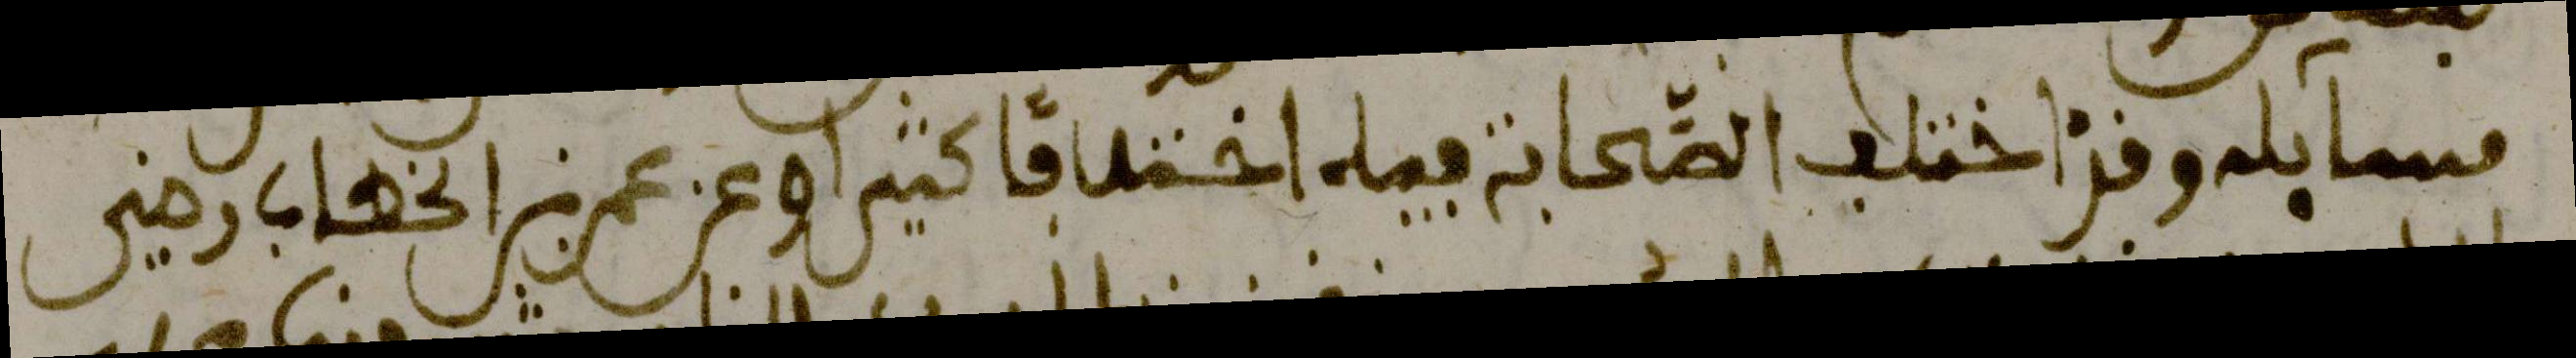مسائله وقد اختلف الصّحابة فيه اختلافا كثيرا وعن عمر بن الخطاب رضي
